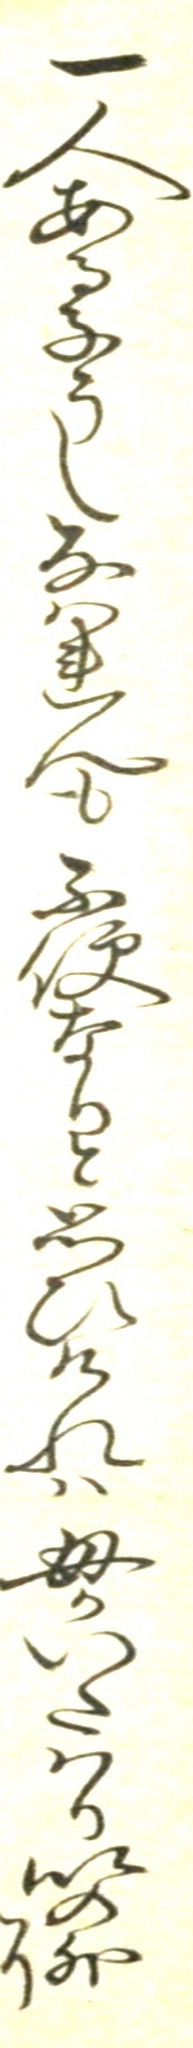一人ある子うしなはれんも不便なりと思ひけれは母かいたはり以の外に
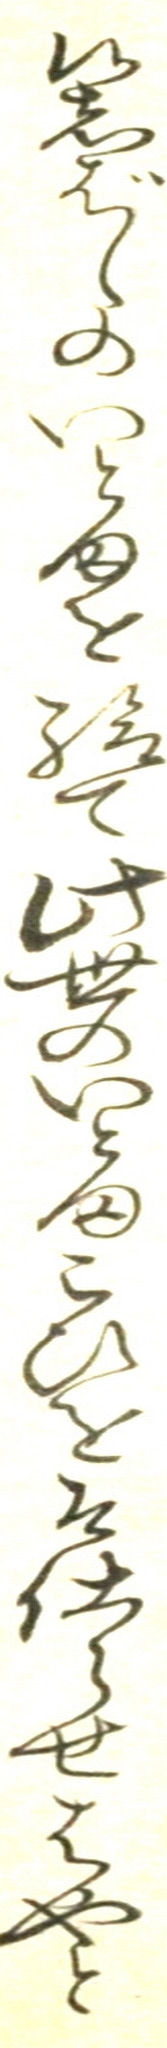候しばしのいとまを給て此世のいとまこひをそ仕らせはやと
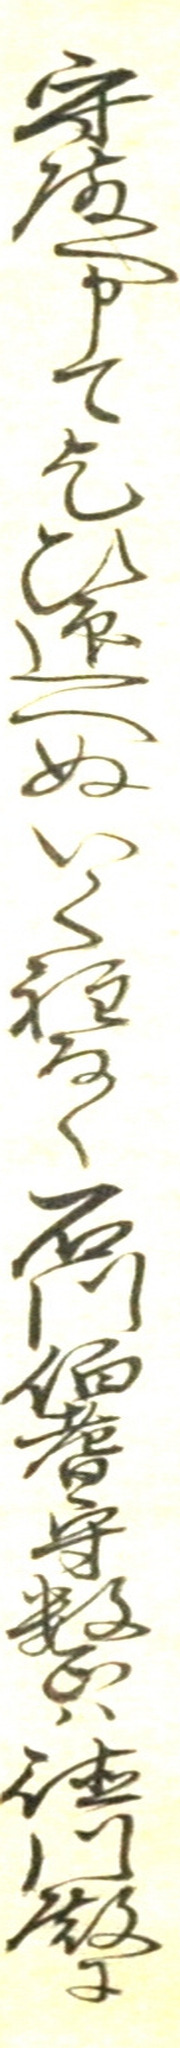守殿へ申て乞ひ迎へぬいく程なく石川伯耆守数正は徳川殿に
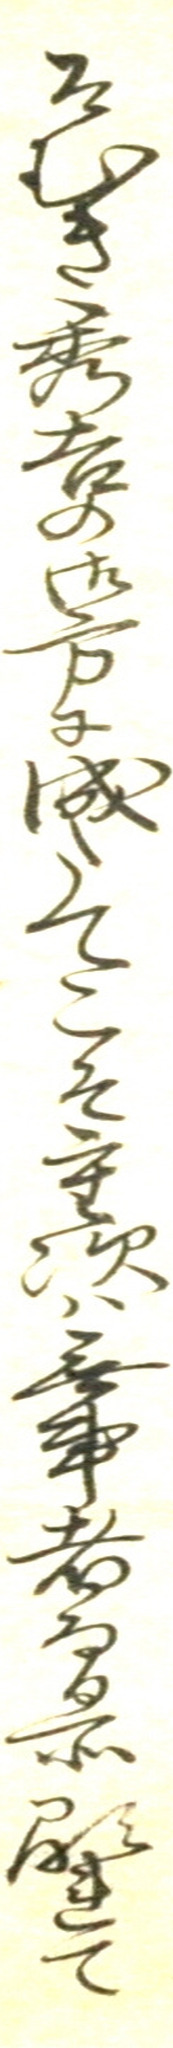そむき秀吉の御方に成たてこそ重次は無事者なる所顕れて
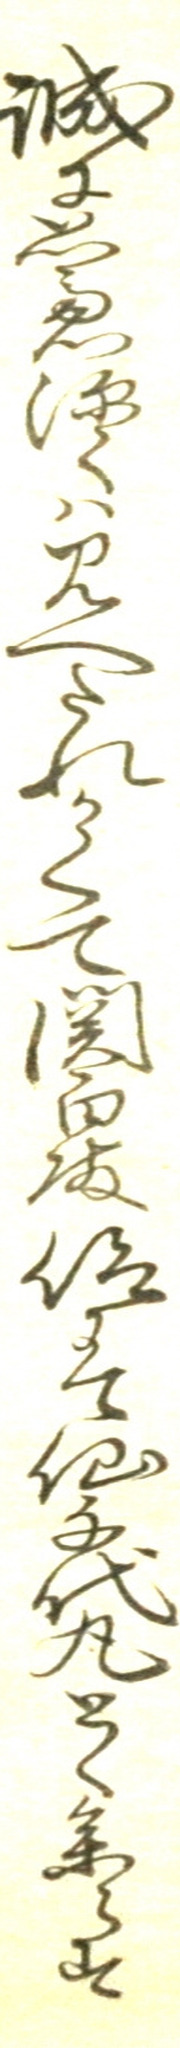誠に思慮深くは見へたれかくて関白殿仰にて仙千代丸とく参らす
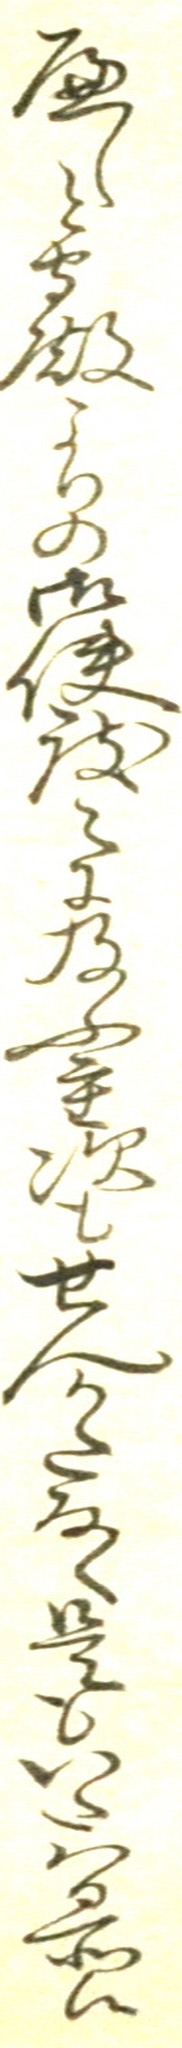へしと守殿よりの御使度々に及ふ重次もせんかたなく是もいたはる所に
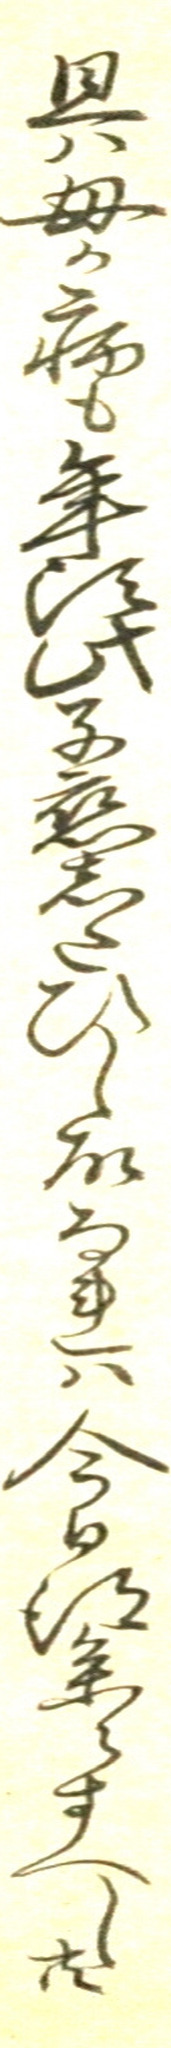且は母か病も年頃此子恋したひし故なれは今日得参らすへし共
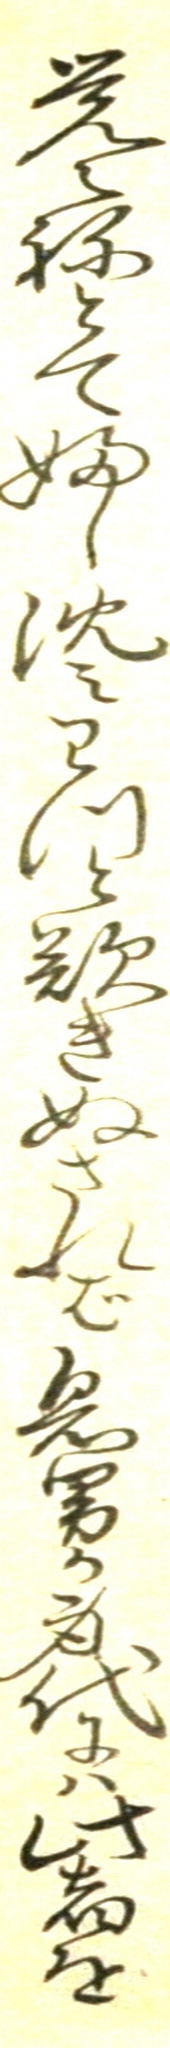覚えねとてふし沈みわつと歎きぬされば息男か身代には此者を
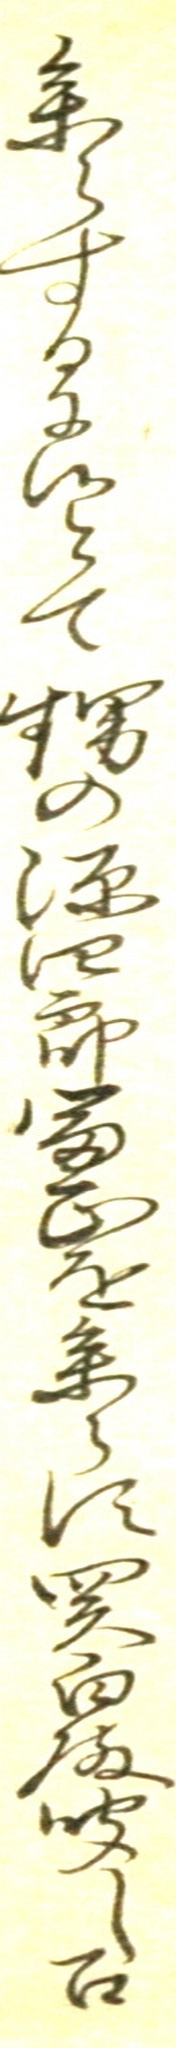参らするに候とて甥の源四郎富正を参らす関白殿聞し召
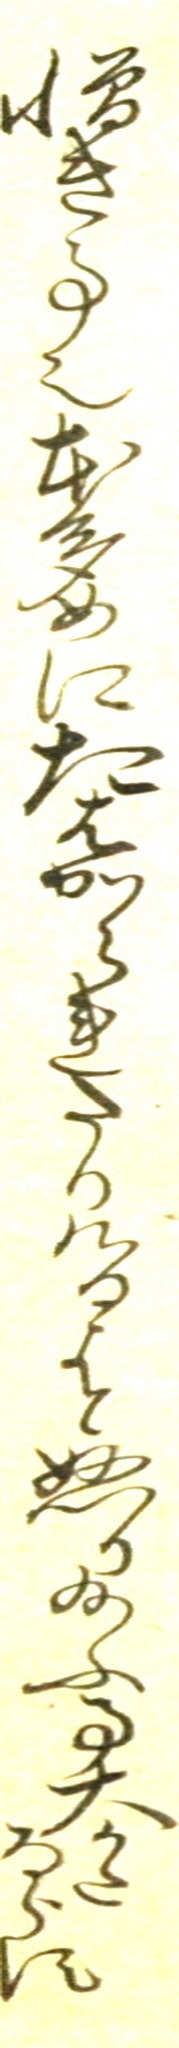憎き事也本多めにたはかられたりけるよと怒り給ふ事大かたならす

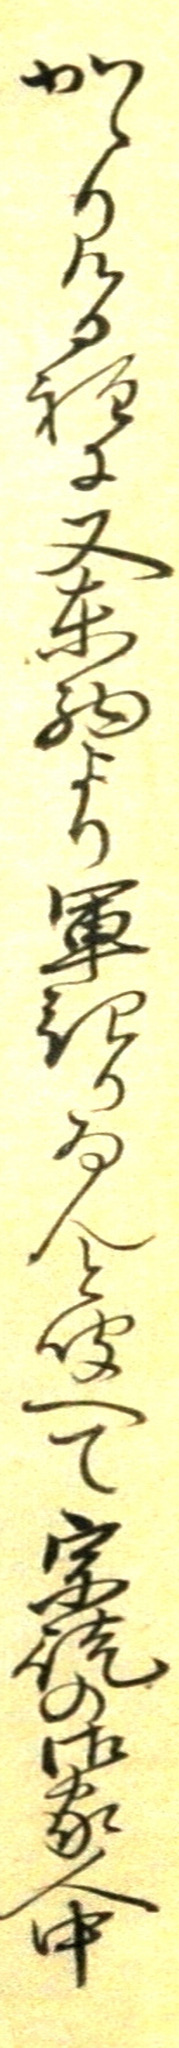かゝりける程に又東西より軍起りなんと聞へて宗徒の御家人中
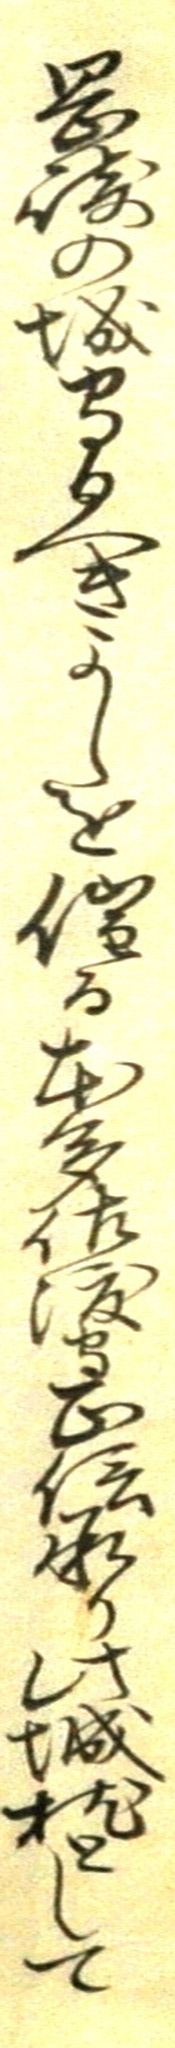岡崎の城守るへきよしを催る本多佐渡守正信承り此城枕として
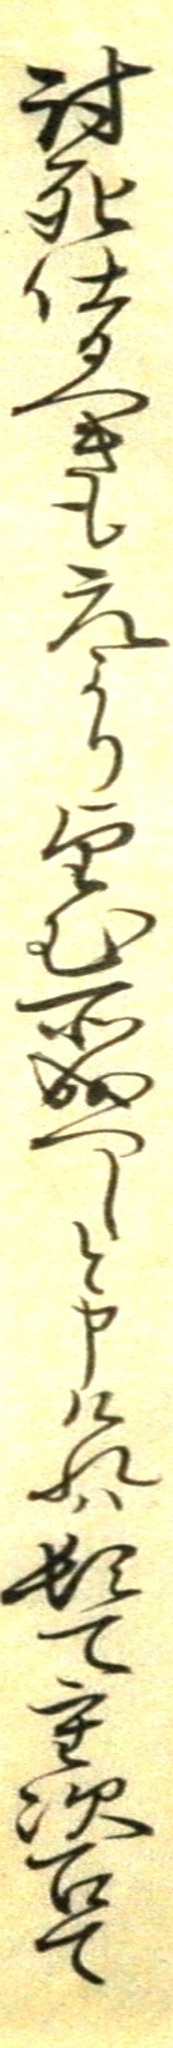討死仕るへきも元より望む所成へしと申けれは頓て重次召て
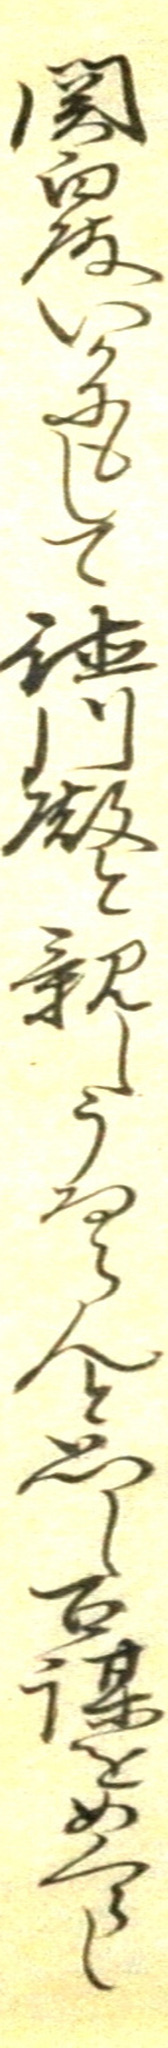関白殿いかにもして徳川殿と親しうならんと思し召謀をめくらし
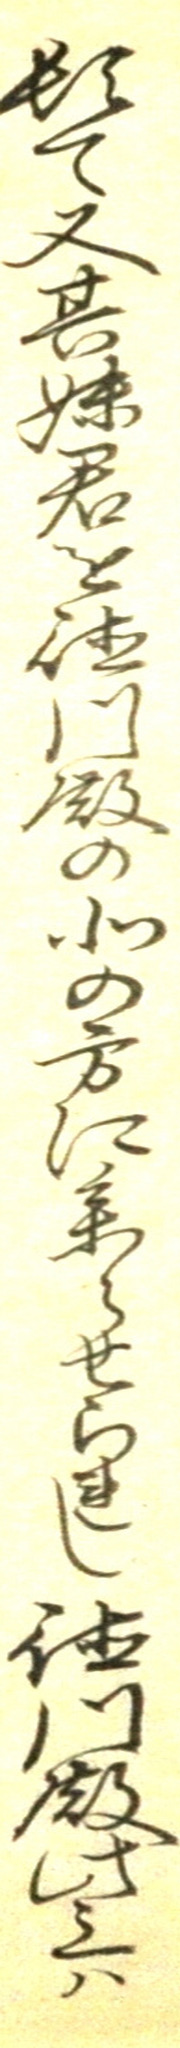頓て又其妹君を徳川殿の北の方に参らせられし徳川殿此上は
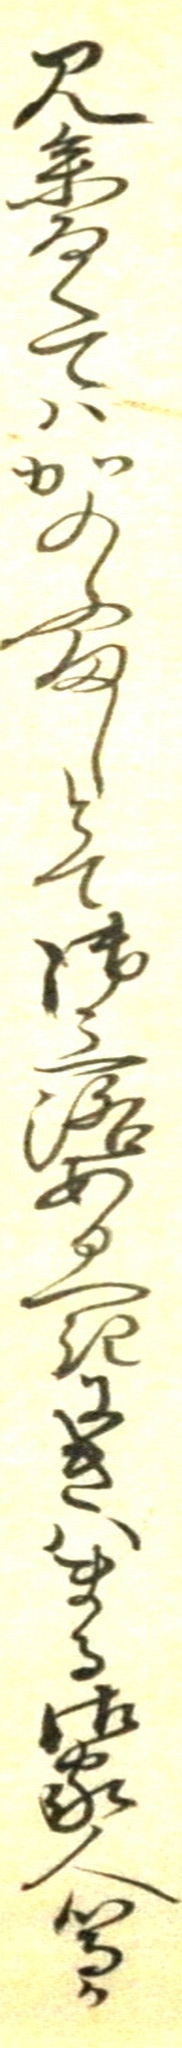見参なくてはかのふましとて御上洛あるへきにきはまる御家人等か
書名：藩翰譜（四・上）
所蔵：伊那市立高遠町図書館・合同会社AMANE
